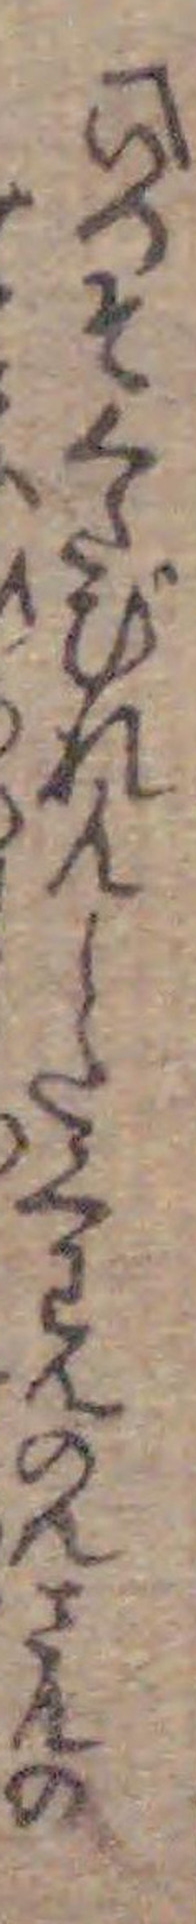〽いつそくたびれんしたくわんのんさんの
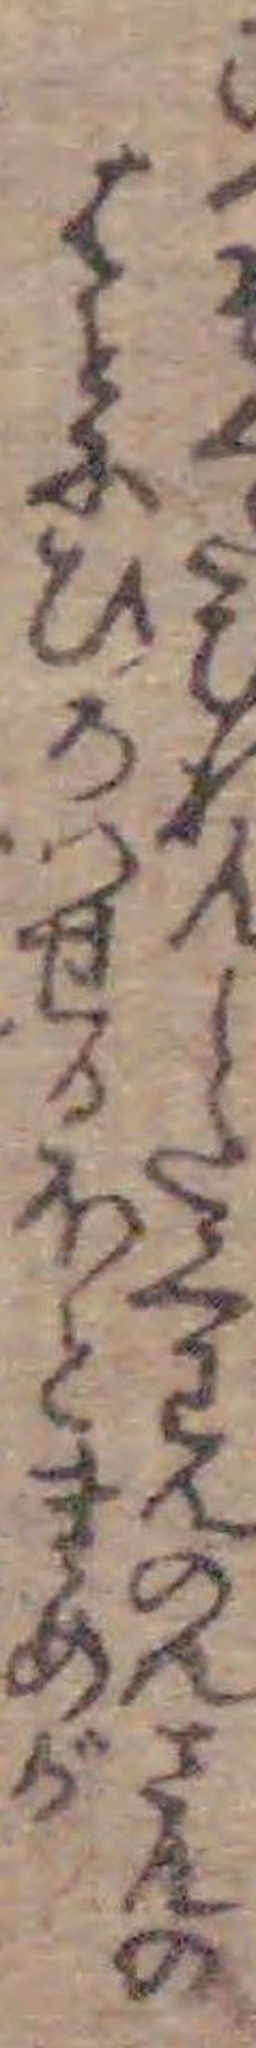はとにひろはせるほとまめが
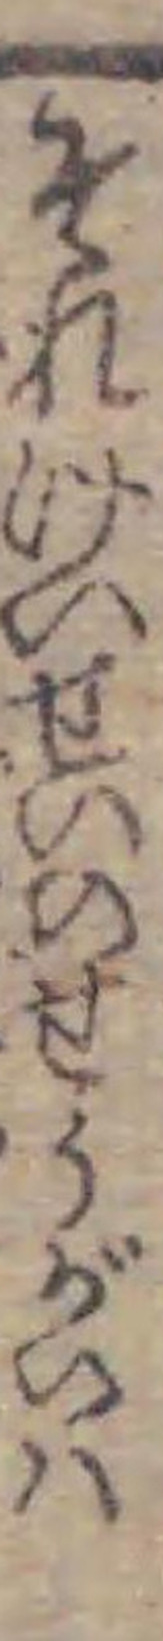それけいせいのせうがいは
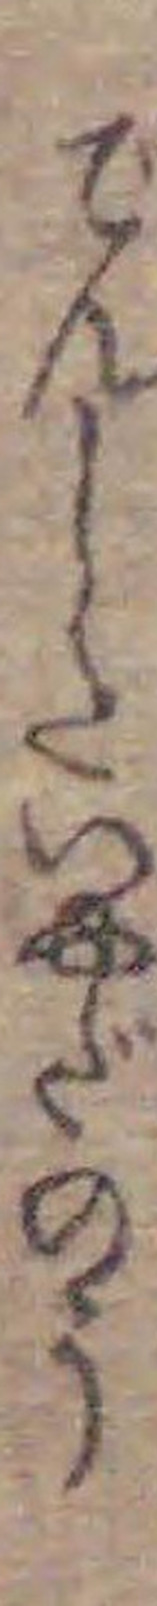でんしたいやだのう
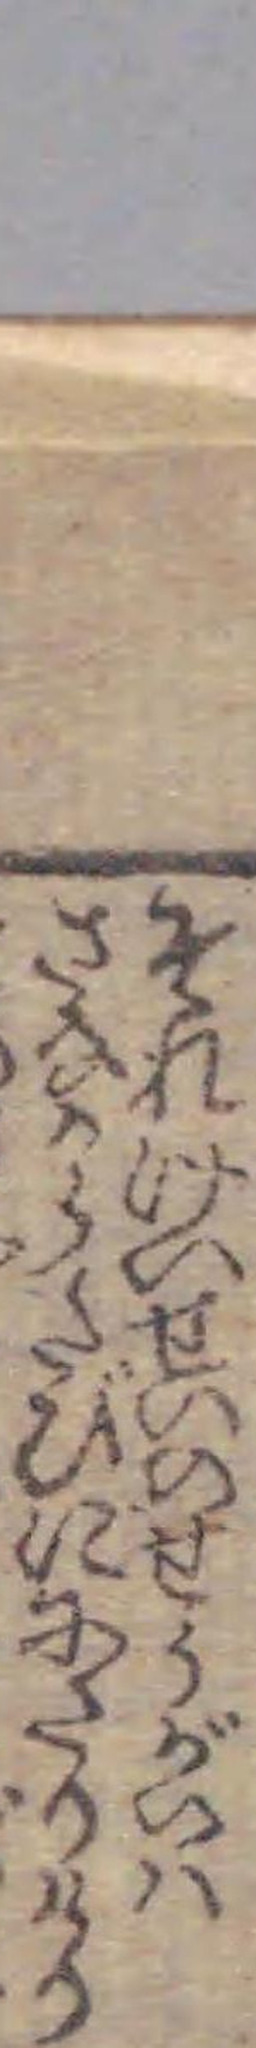さなからたびににたりけり
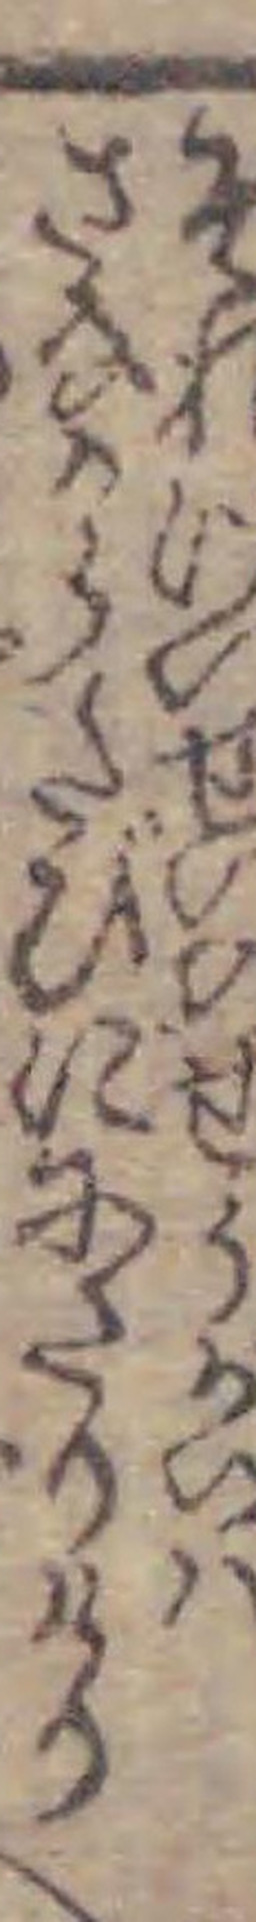さなからたびににたりけり
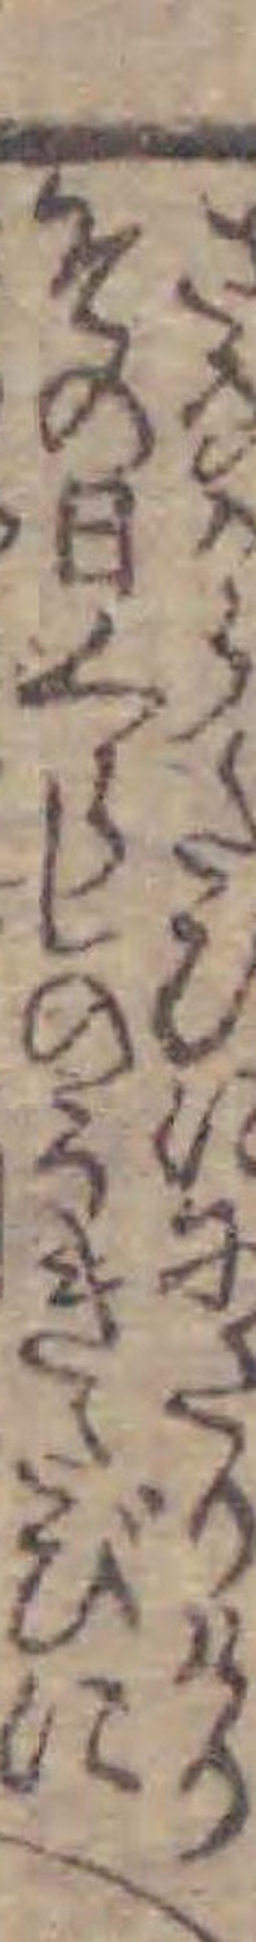その日くらしのうきたびに
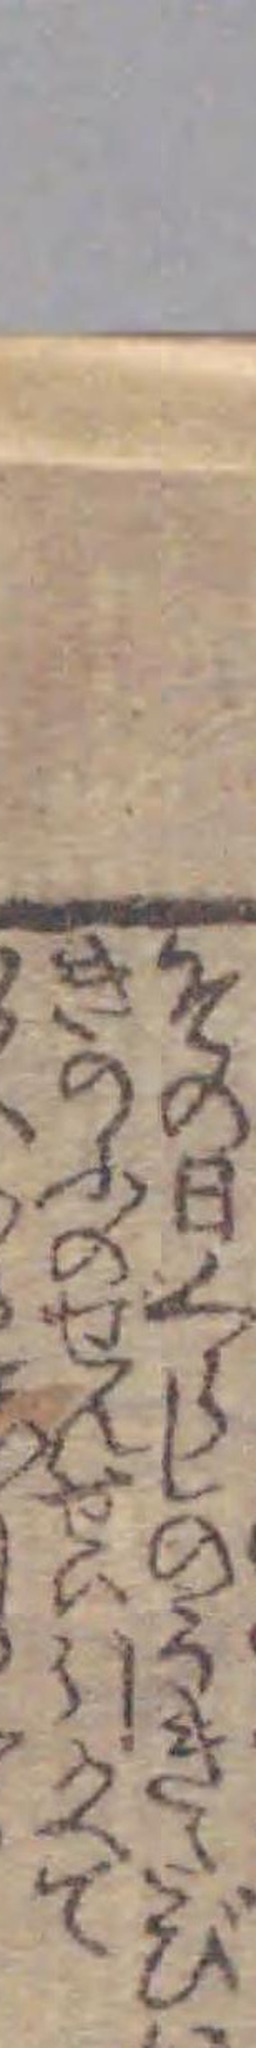きのふのせんせい引かへて
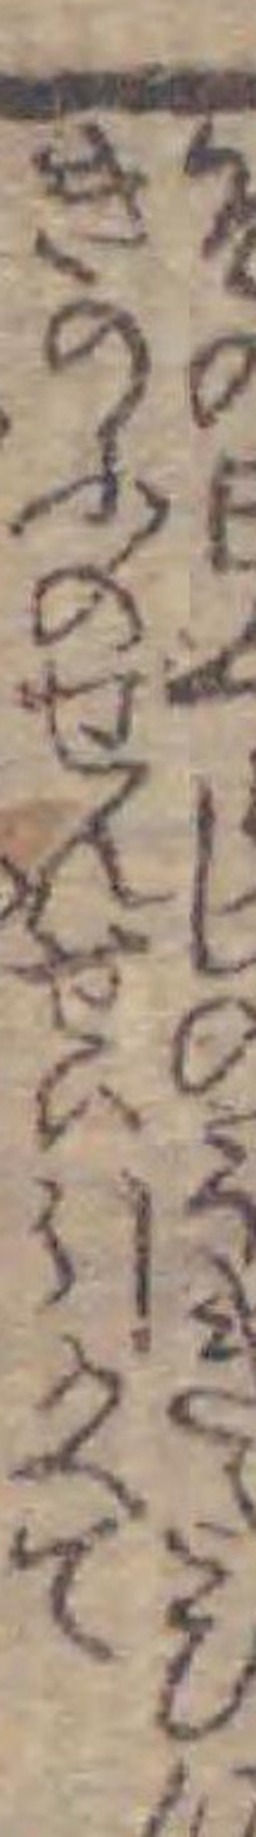きのふのせんせい引かへて
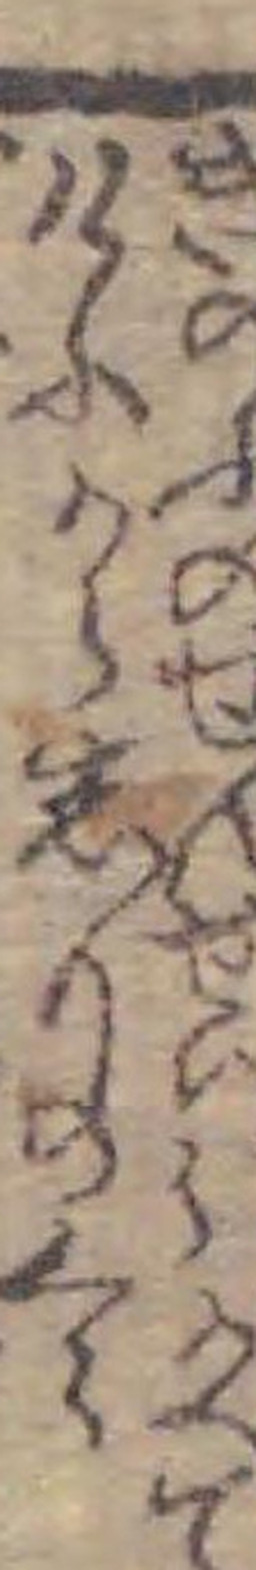けふからしりのくら
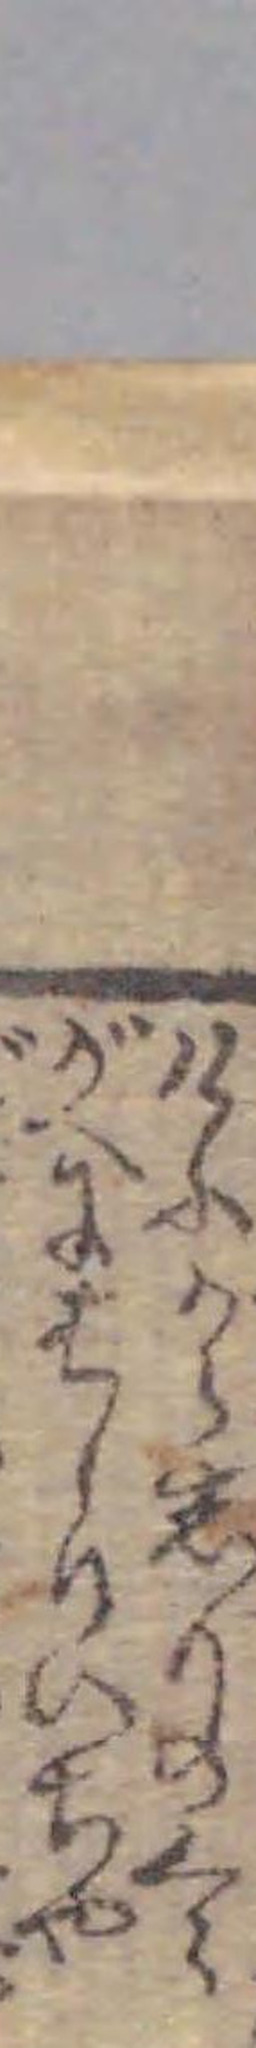がへにはしりいちや
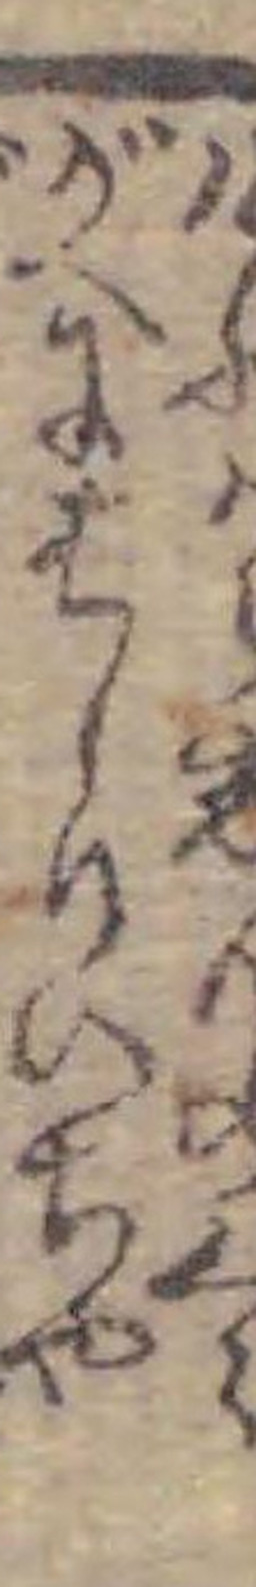がへにはしりいちや
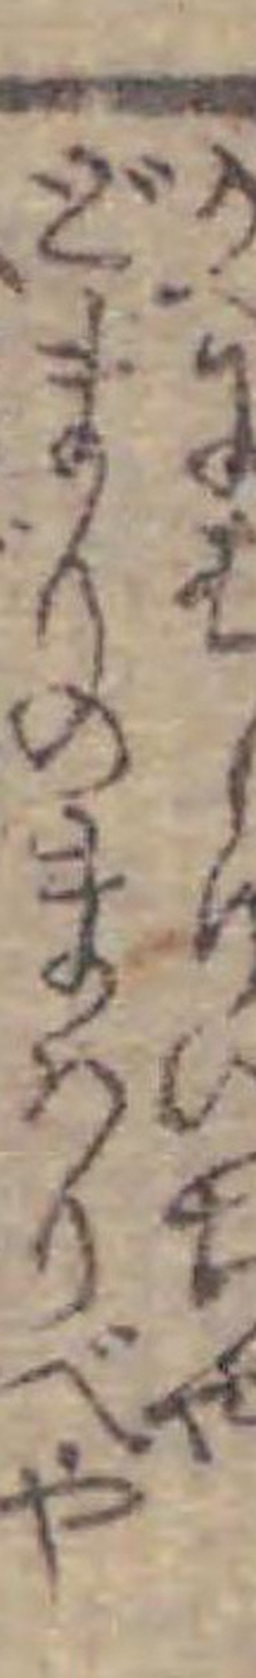どまりのまはりべや
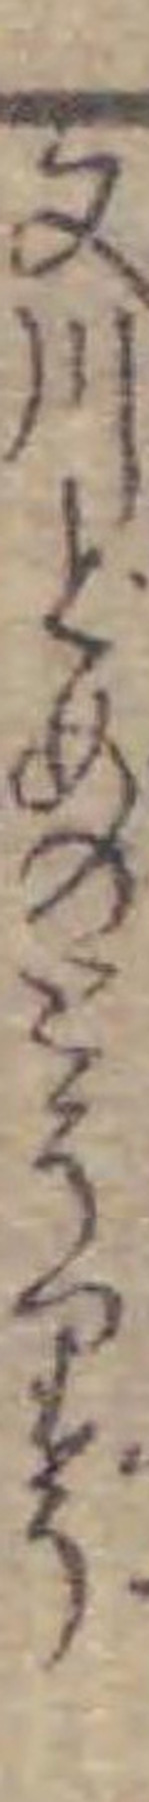又川どめのとうりう
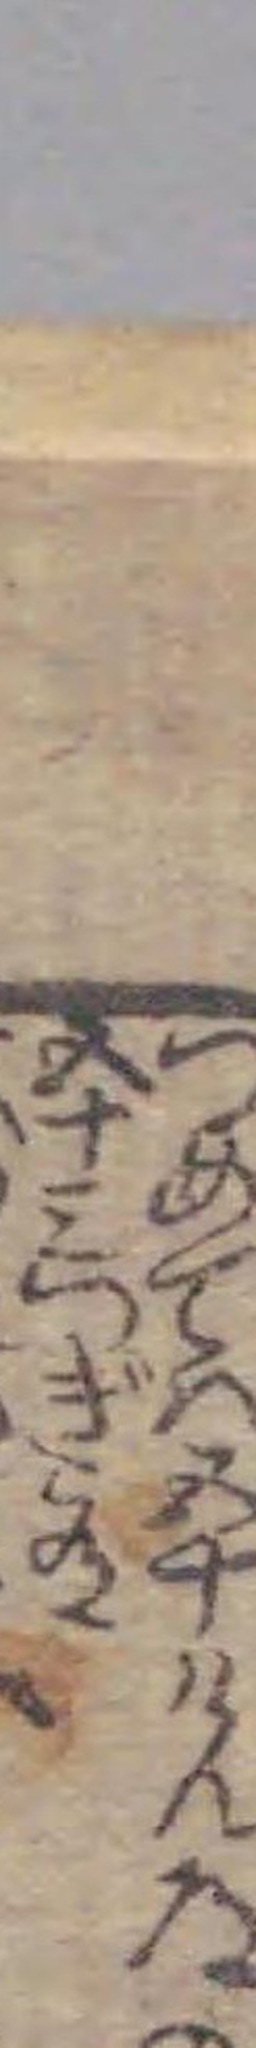五十三つぎ有
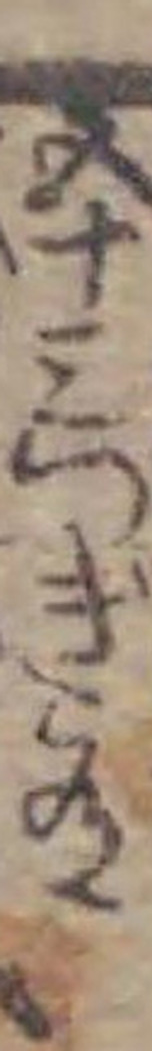五十三つぎ有
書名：北国順礼唄方便 : 3巻
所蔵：国立国会図書館 National Diet Library, JAPAN
